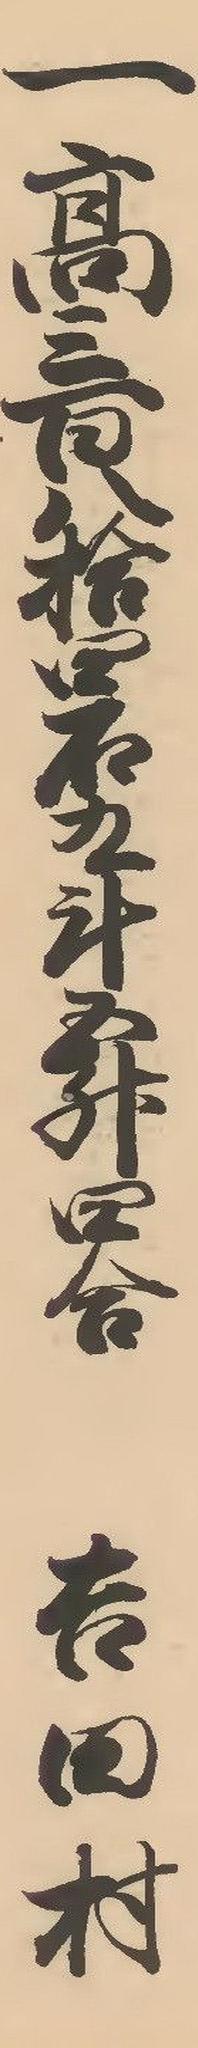一髙三百八拾四石九斗五升四合吉田村

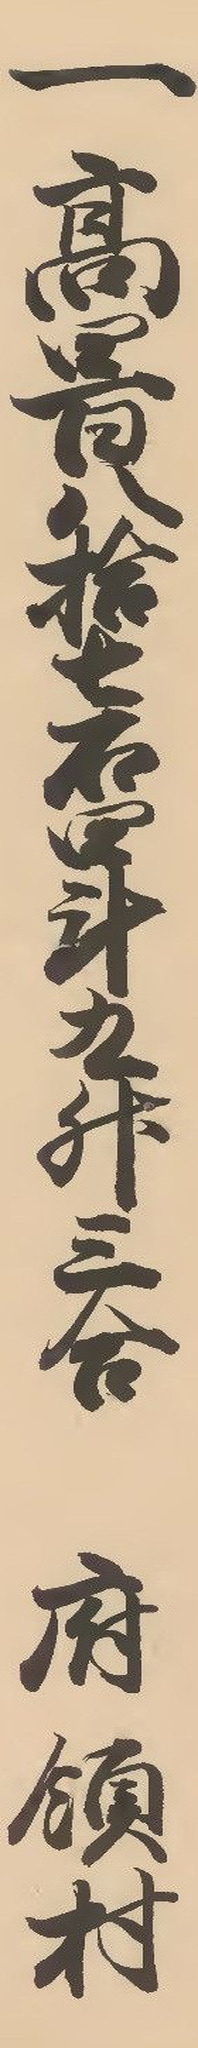一髙四百八拾七石四斗九升三合府領村
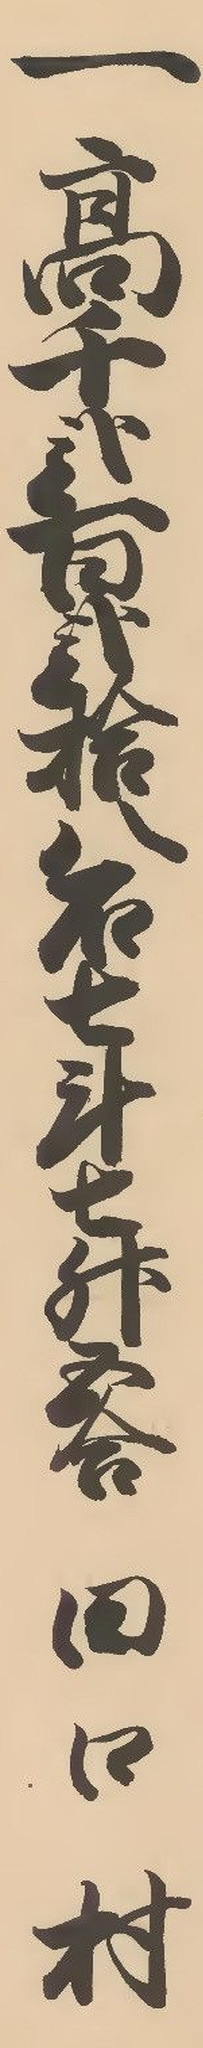一髙千弐百弐拾八石七斗七升五合田口村
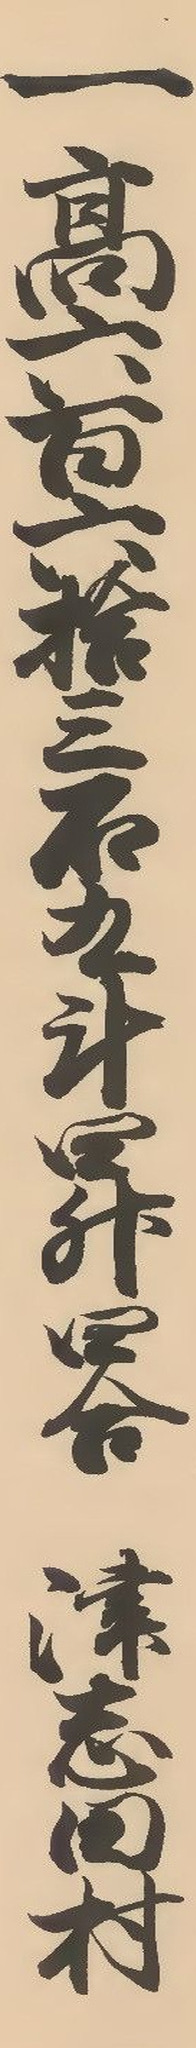一髙六百六拾三石九斗四升四合津志田村
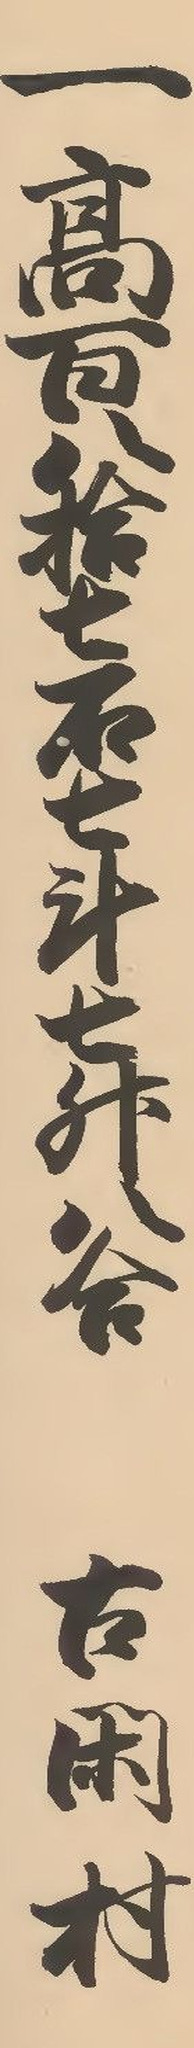一髙百八拾七石七斗七升八合古閑村
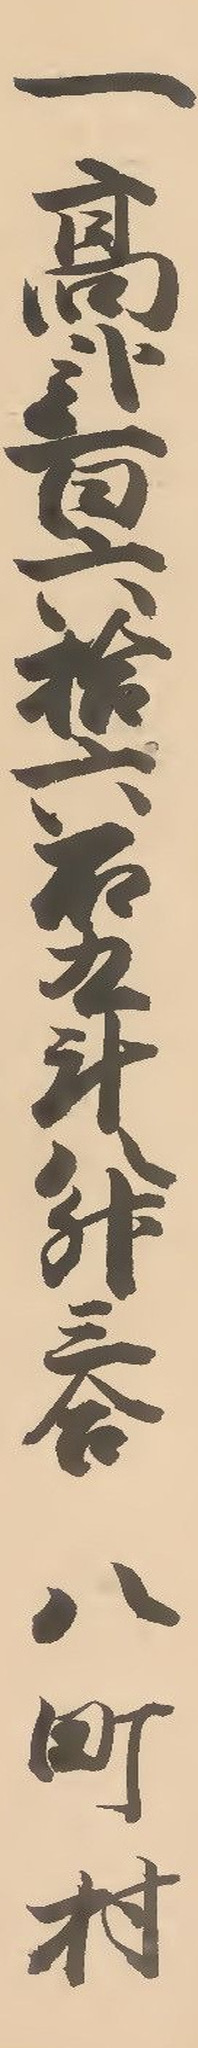一髙弐百六拾六石九斗八升三合八町村
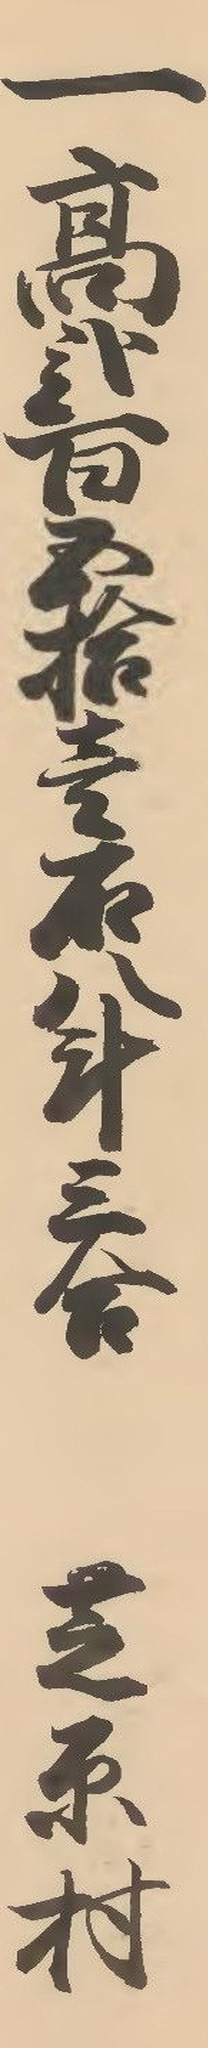一髙弐百五拾壱石八斗三合芝原村
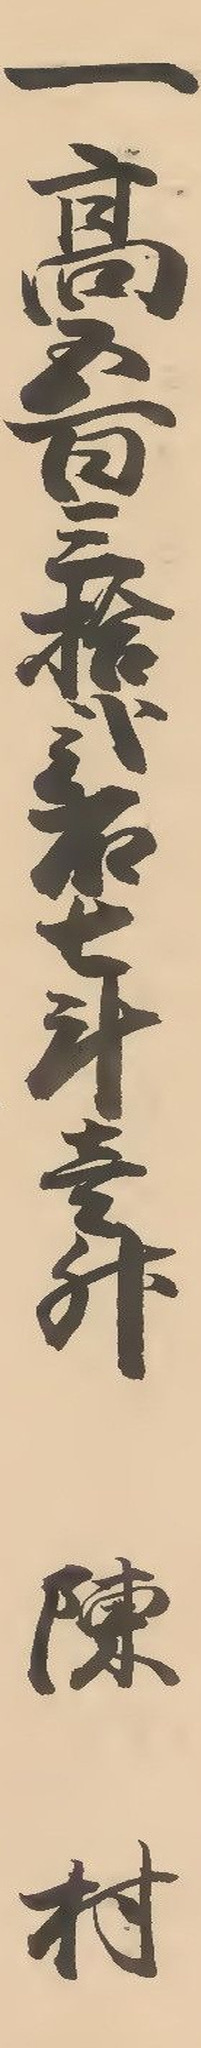一髙五百三拾弐石七斗壱升陳村
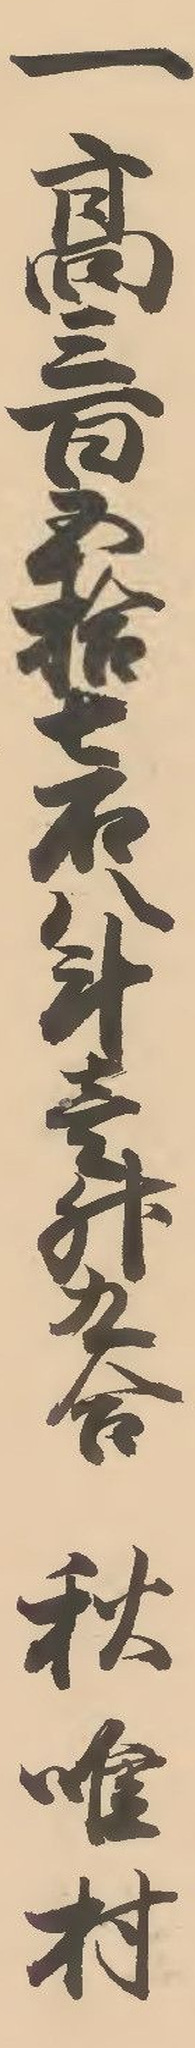一髙三百五拾七石八斗壱升九合秋唯村

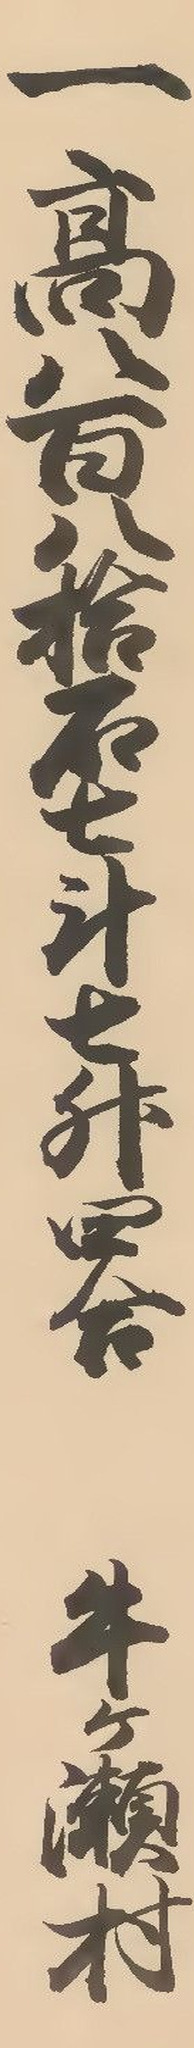一髙八百八拾石七斗七升四合牛ケ瀬村
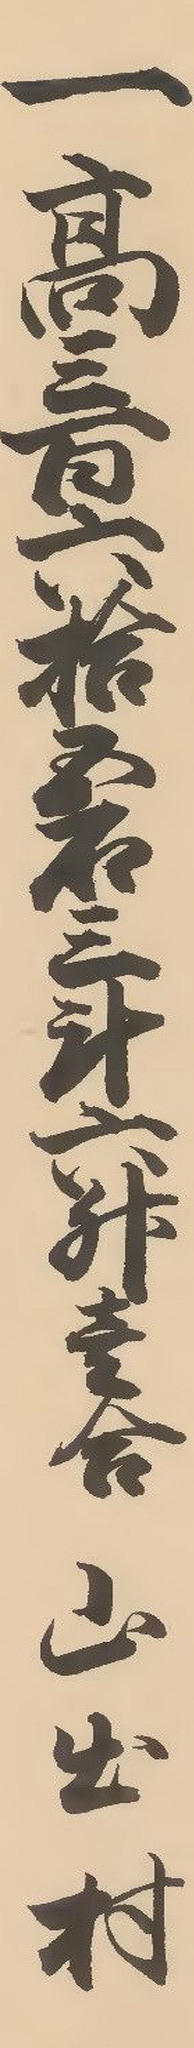一髙三百六拾五石三斗六升壱合山出村
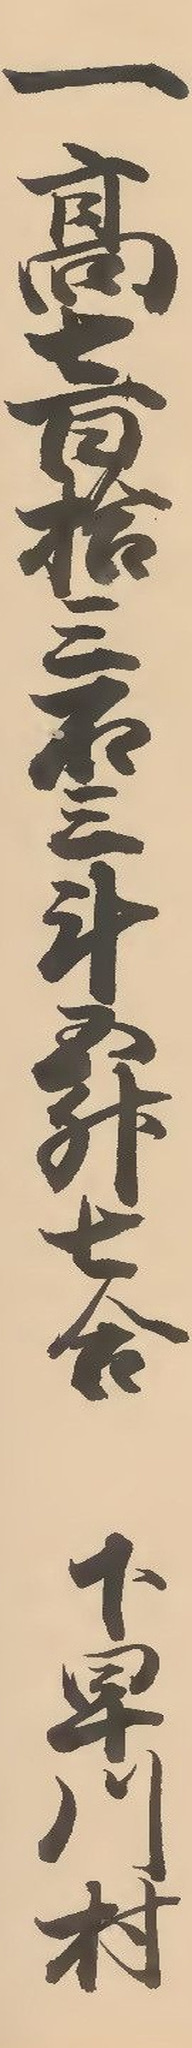一髙七百拾三石三斗五升七合下早川村
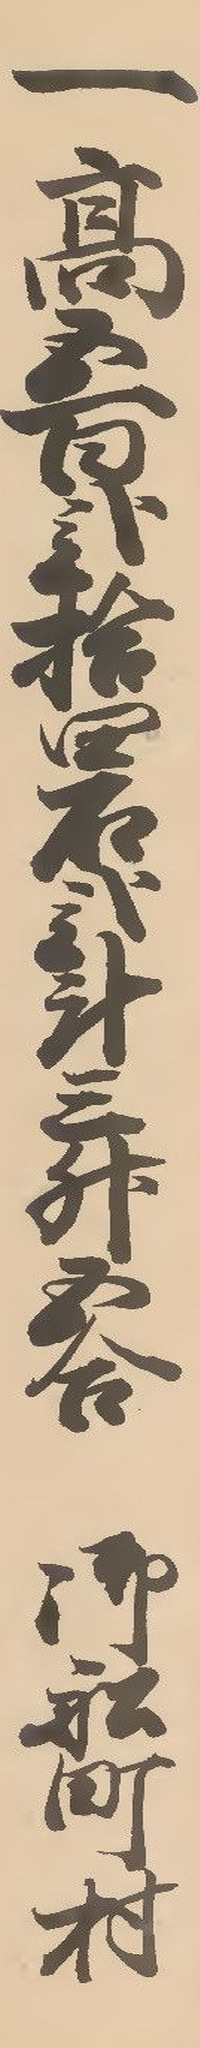一髙五百弐拾四石弐斗三升五合御舩町村
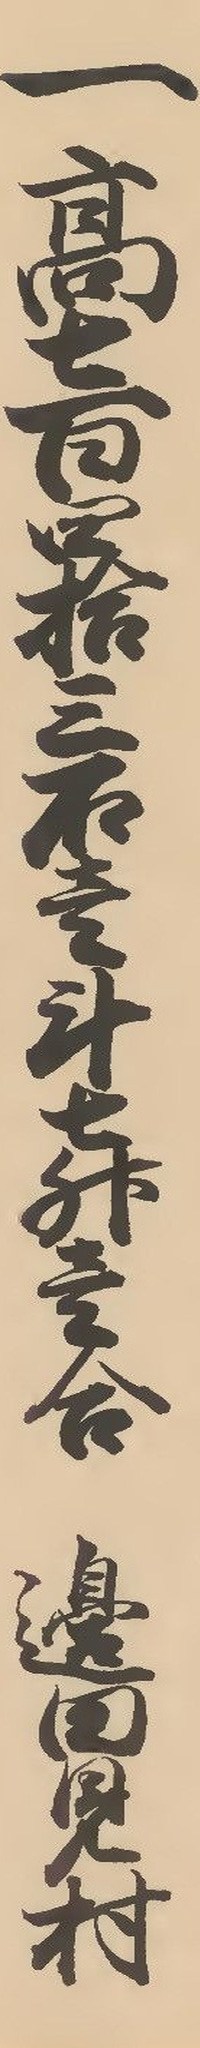一髙七百四拾三石壱斗七升壱合邉田見村
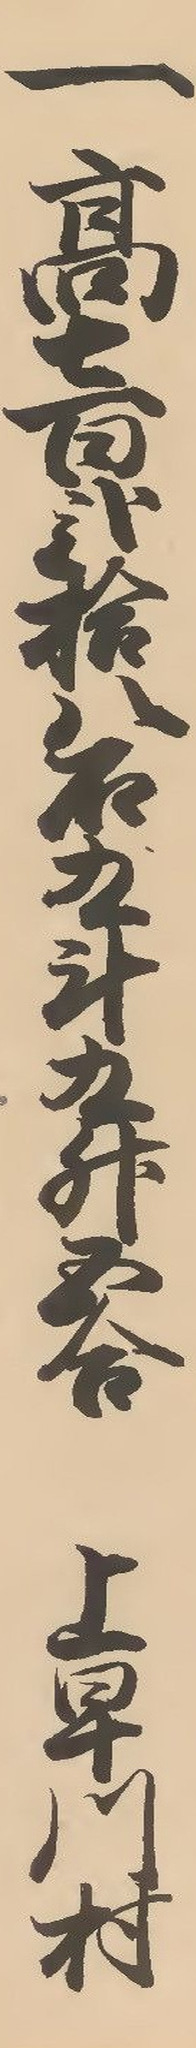一髙七百弐拾八石九斗九升五合上早川村
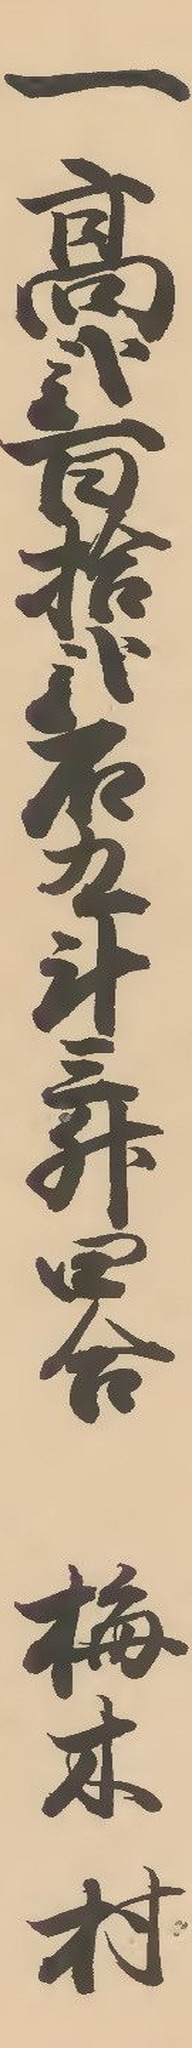一髙弐百拾弐石九斗三升四合梅木村
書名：肥後国郷帳
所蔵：国立公文書館 National Archives of Japan
